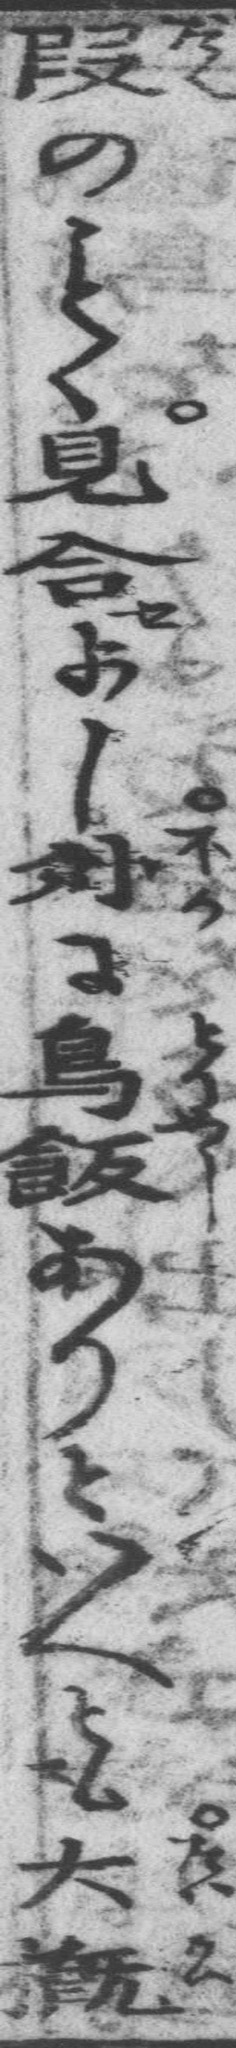段のことく。見合せよし。外に鳥飯ありといへとも。大概
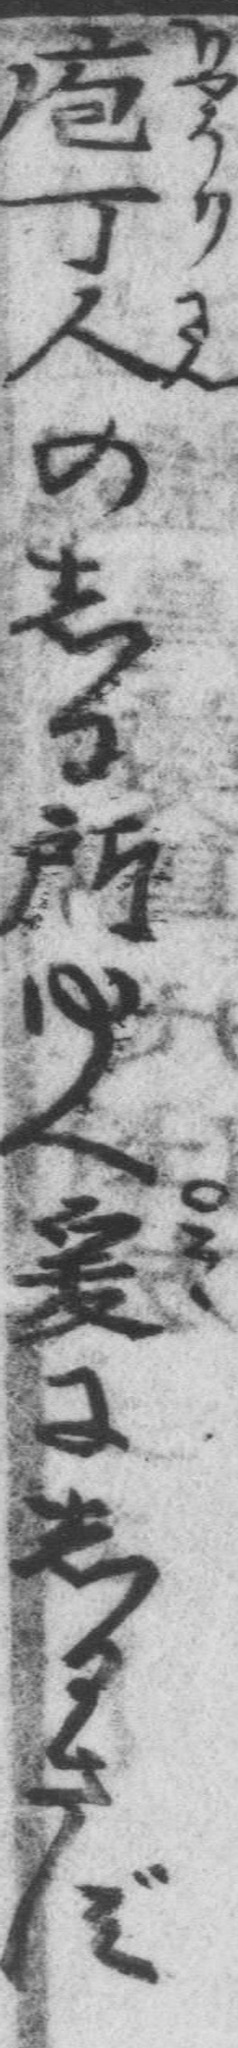包丁人のしる所ゆへ。爰にしるさず
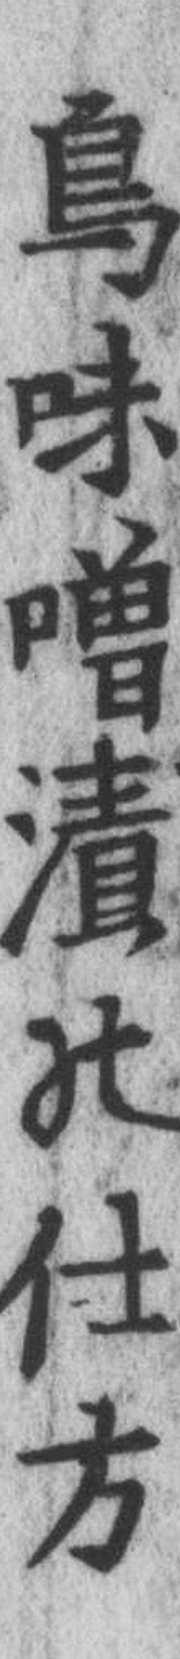鳥味噌漬の仕方
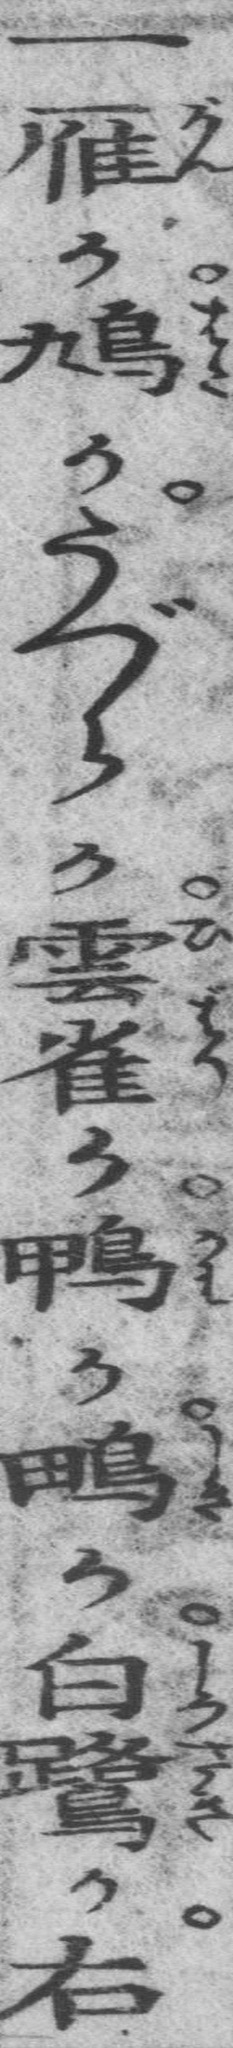一雁か。鳩か。うづらか。雲雀か。鴨か。鴫か。白鷺か。右
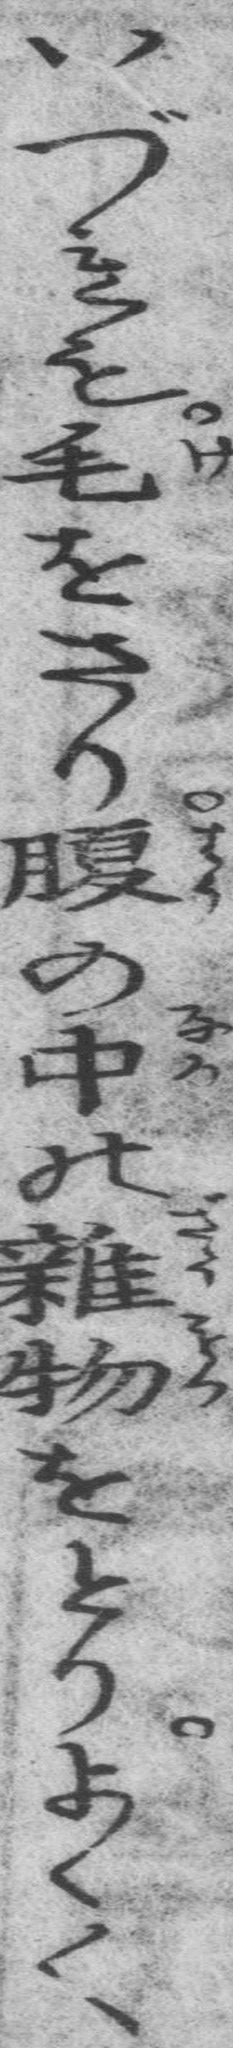いづれも。毛をさり。腹の中の雑物をとり。よく〳〵
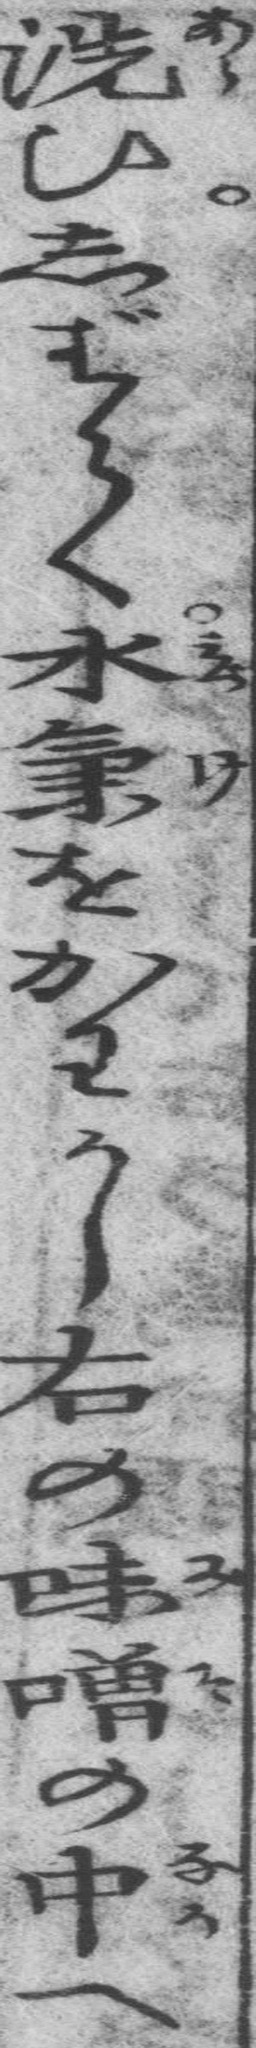洗ひ。しばらく。水気をかわかし右の味噌の中へ
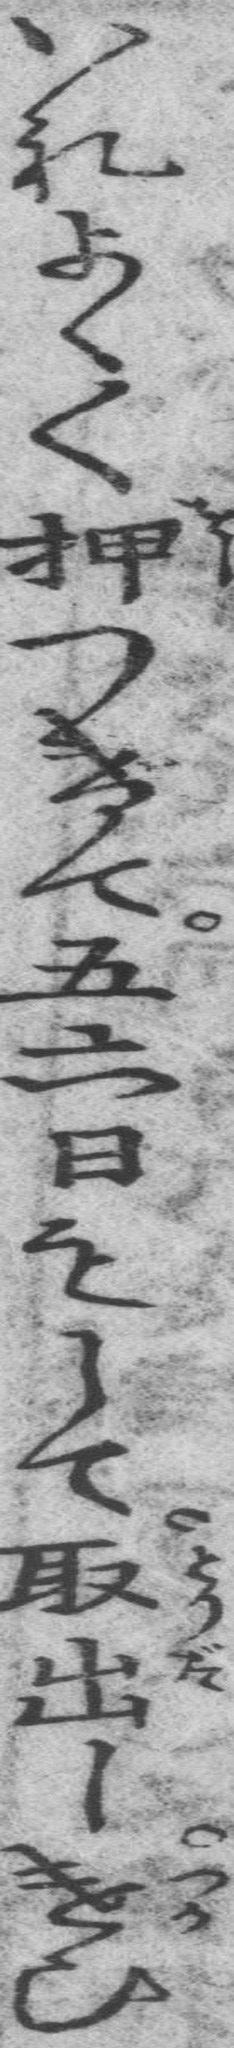いれよく〳〵押つけて。五六日もして。取出し。遣ひ
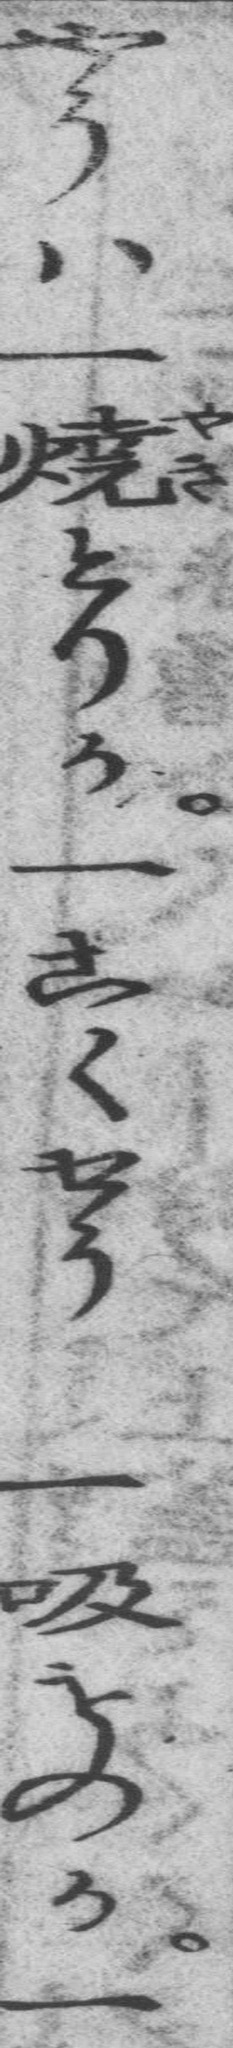やうは一焼とりか。一こくせう一吸ものか。一
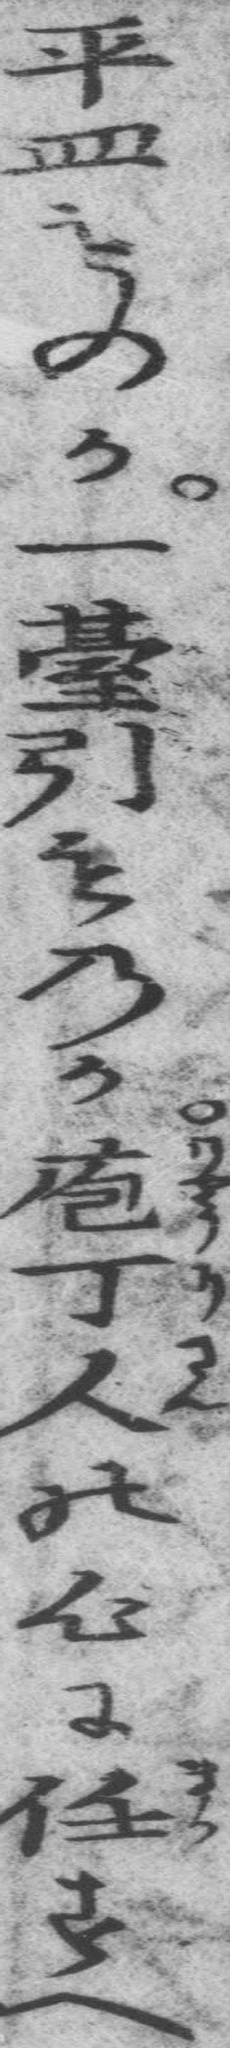平皿ものか。一台引ものか。包丁人の心に任すへ
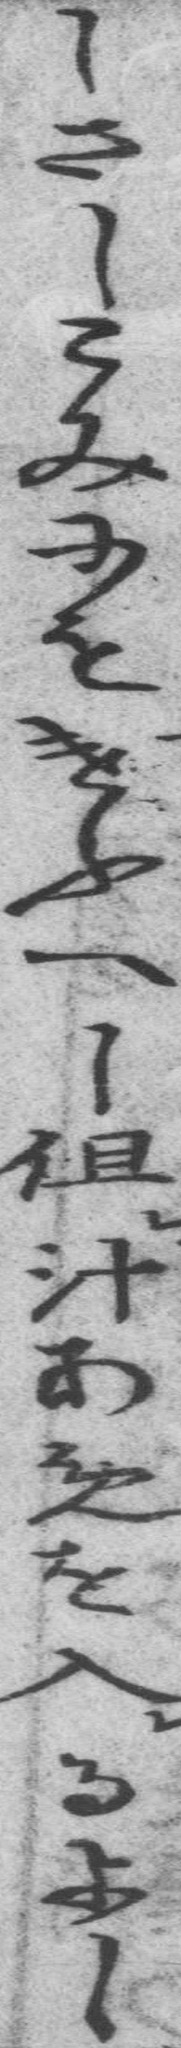しさしこみにも。遣ふへし。但し汁あめを入れるよし
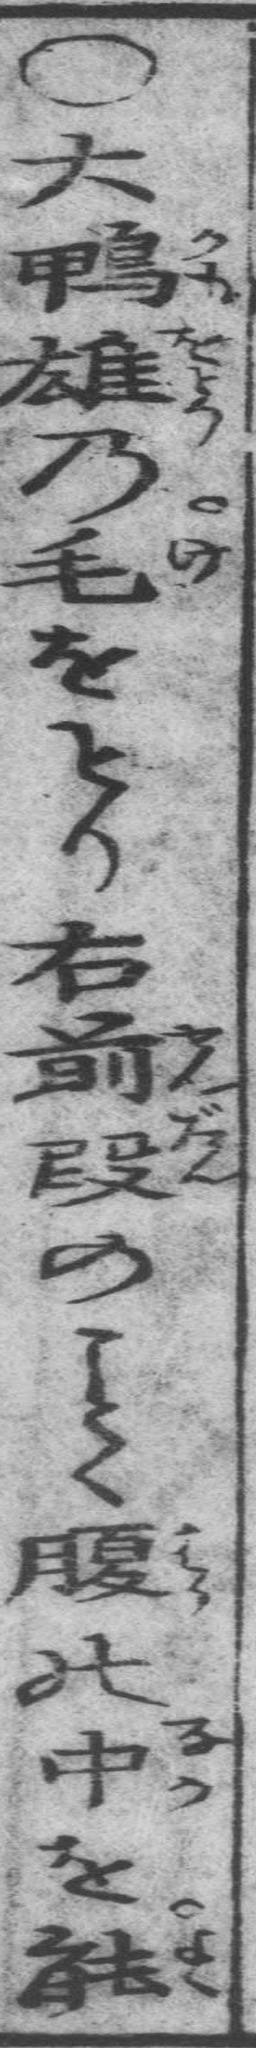○大鴨雄の。毛をとり右前段のことく腹の中を。能

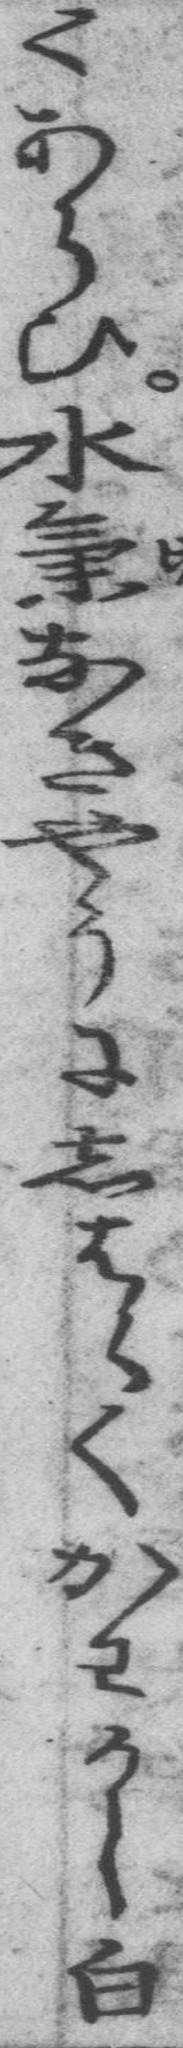くあらひ。水気なきやうにしはらくかわかし。白
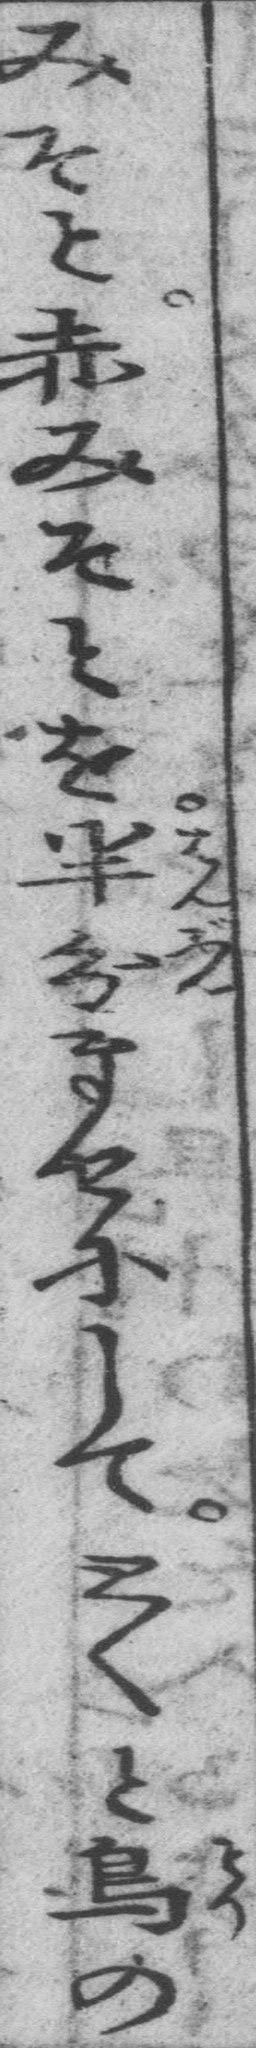みそと。赤みそとを。半分ませにして。とくと鳥の
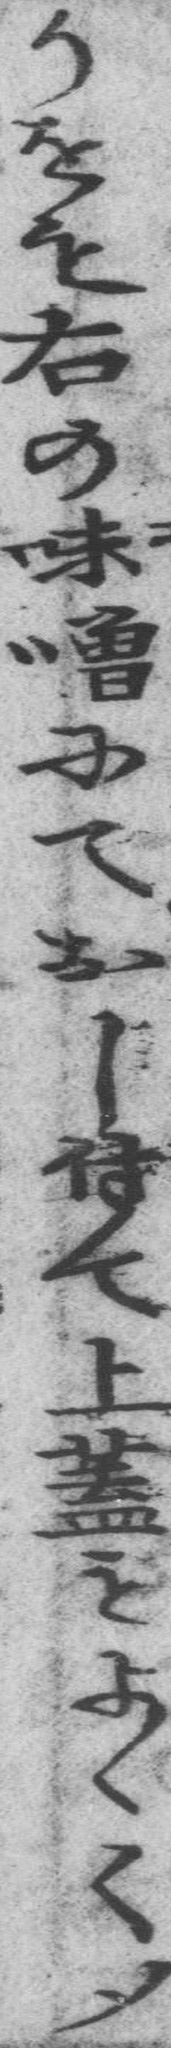りをも右の味噌にて。おし付て。上蓋もよく〳〵〆
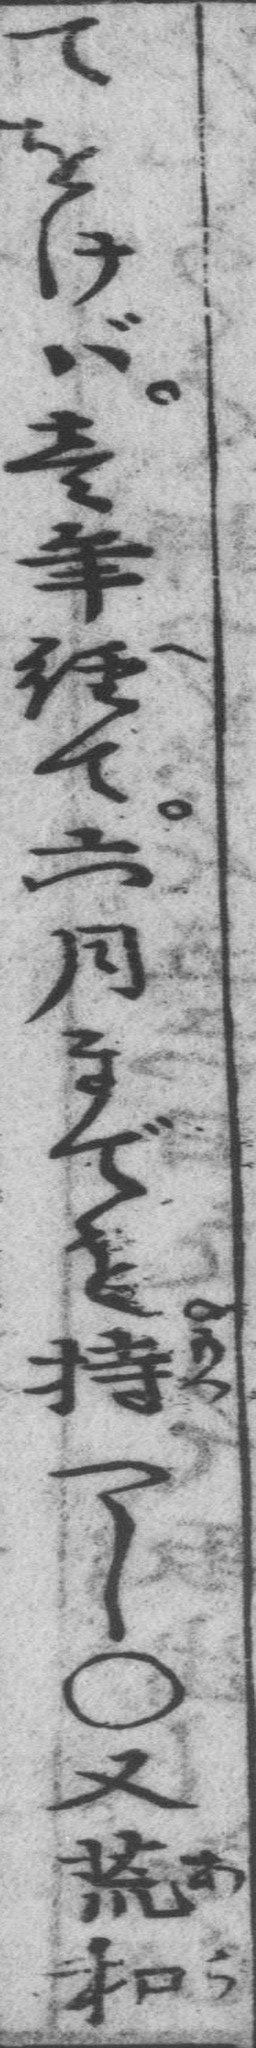てをけば。壱年経て。六月までも。持へし○又荒和
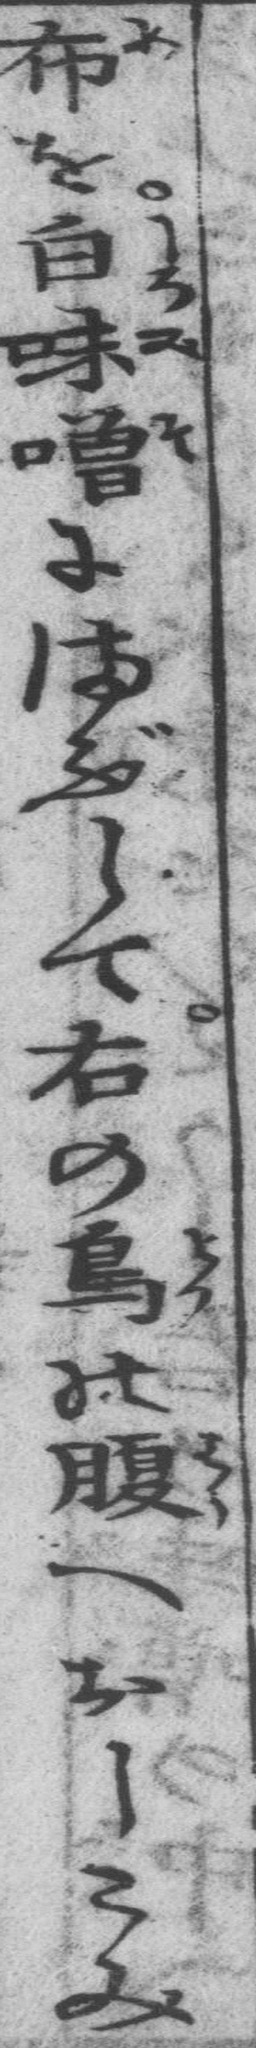布を。白味噌につぶして。右の鳥の腹へおしこみ
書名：萬寳料理秘密箱
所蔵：大阪府立大学学術情報センター 国文学研究資料館
